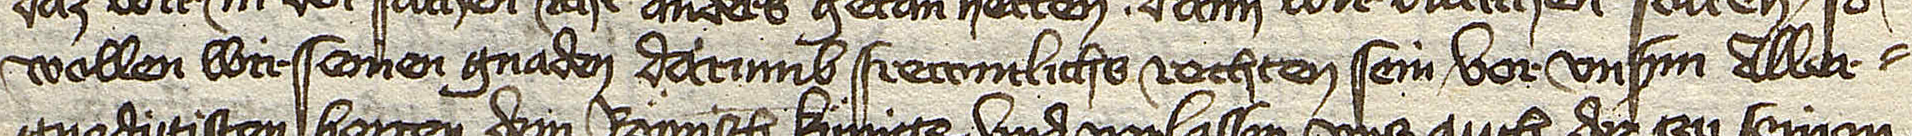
wollen wir ſeinen gnaden darumb frewntlichs rechten ſein / vor vnſ*m Aller =
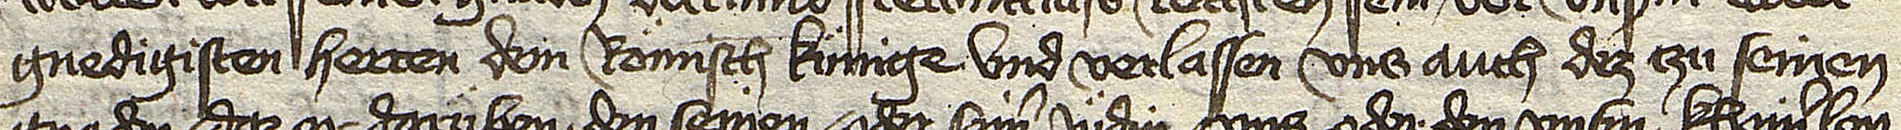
gnedigiſten herren dem Römiſch* künige vnd verlaſſen vns auch deʒ cʒu ſeinen
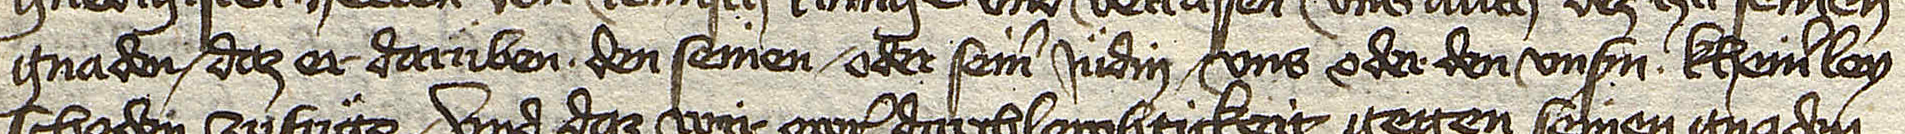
gnaden / daʒ er darüber . den ſeinen / oder ſein* Iüdin / vns oder den vnſ*n khein*ley
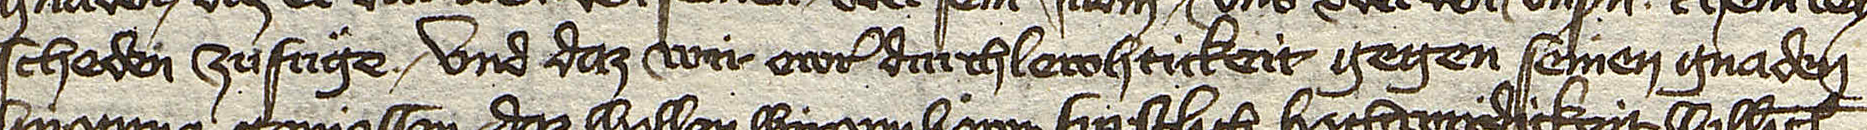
ſcheden cʒufüge / Vnd daʒ wir ewr* durchlewhtickeit gegen ſeinen gnaden
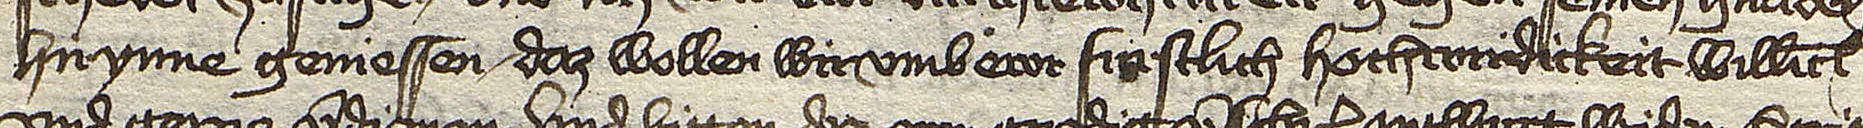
hirynne genieſſen / daʒ wollen wir vmb ewr furſtlich hochwirdickeit willicl*
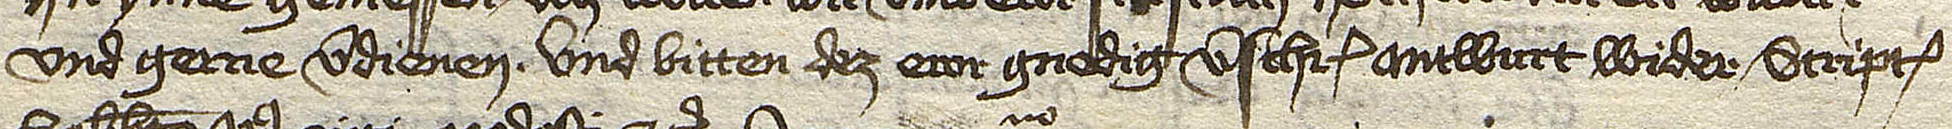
vnd gerne v*dienen . vnd bitten deʒ ewr gnedig v*ſchr* antwurt wider / Script*
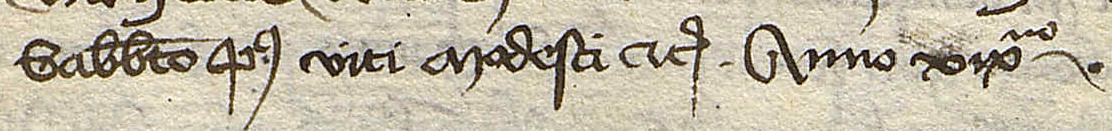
Sabbto* p* viti Modeſti ec* . Anno xix* / .
